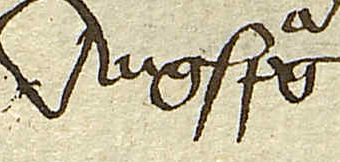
Augſp*g
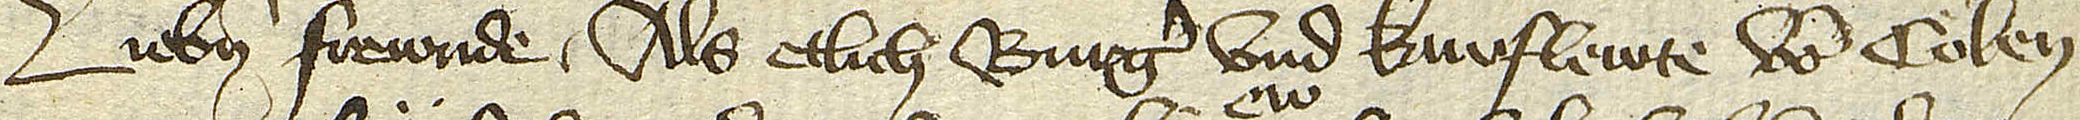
Liebn* frewnde / Als etlich Burg* vnd kawflewte vo* Cölen
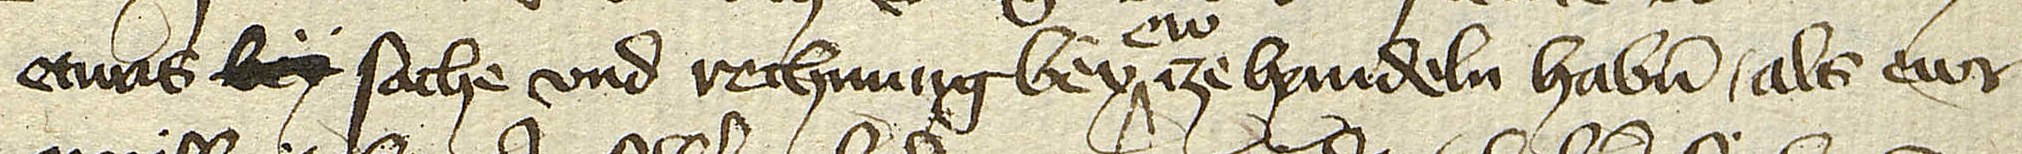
etwas bey ſache vnd rechnung bey cʒe handeln habn* / als ewr
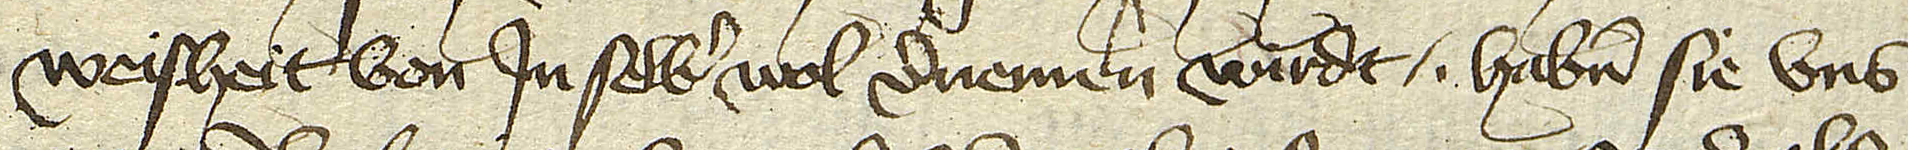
weiſheit von In ſelb* wol v*nomen wirdt / . habn* ſie vns
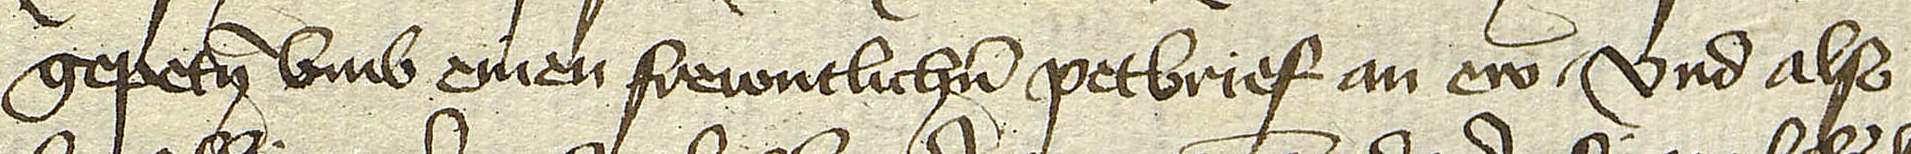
gepetn* vmb einen frewntlichn* petbrief an ew / Vnd alſo
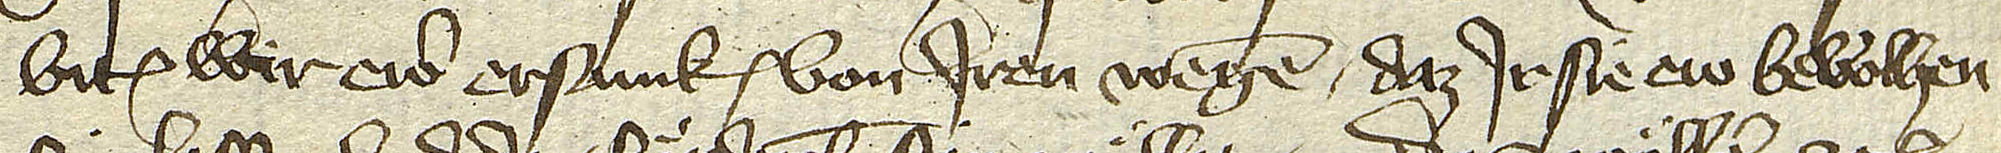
bit* wir ew* erſamk* von Iren wege* / daʒ Ir ſie ew bevolhen
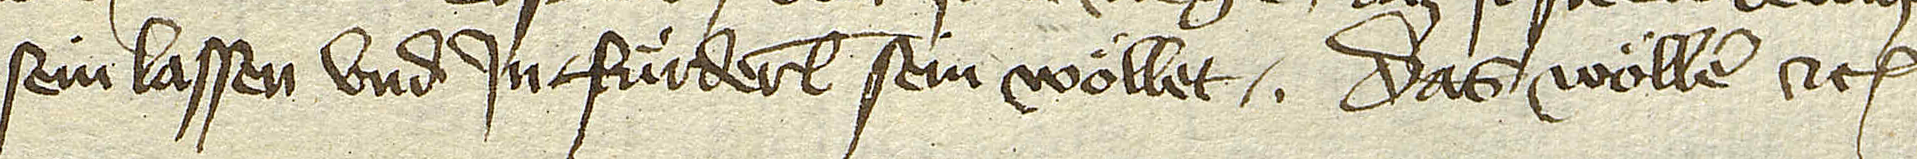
ſein laſſen vnd In fürderl* ſein wöllet / . Das wölle* ec*
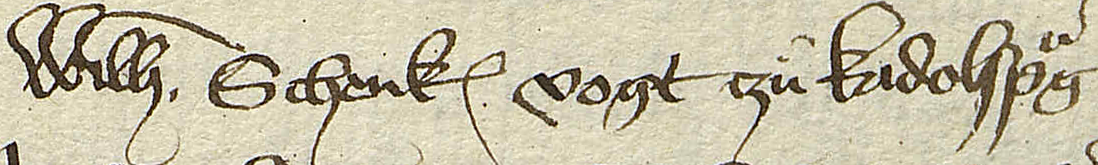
Wilh* Schenk vogt cʒü kadolſp*g
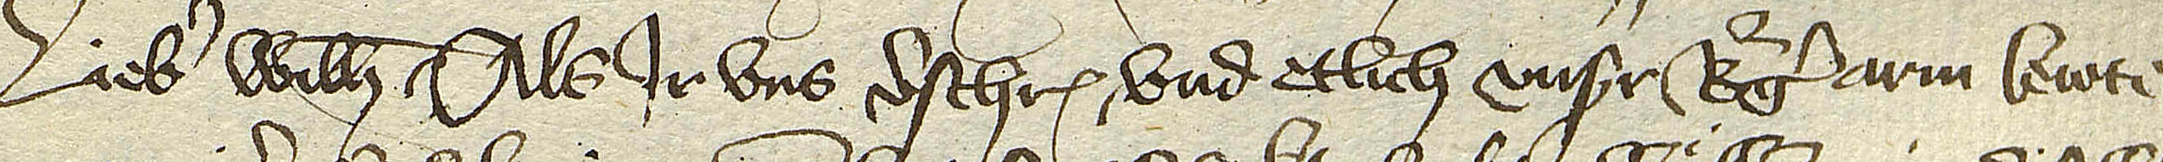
Lieb* Wilh* / Als Ir vns v*ſchr* / vnd etlich vnſ*r B*g* arm lewte
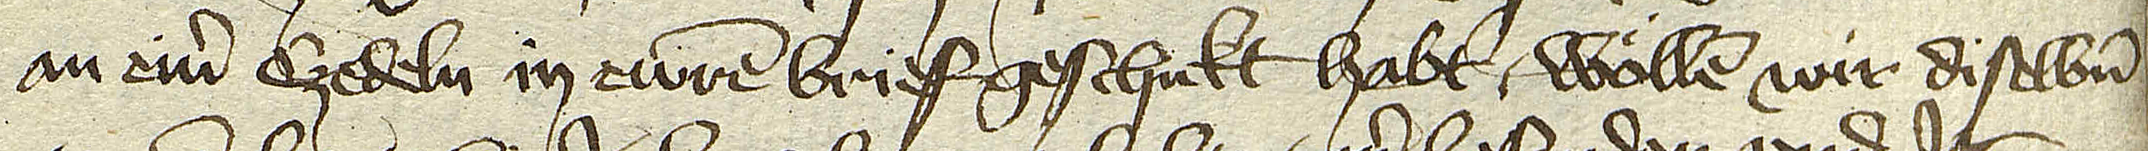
an ein* Cʒedeln in ewre* brief geſchickt habt / wölle* wir diſelbn*
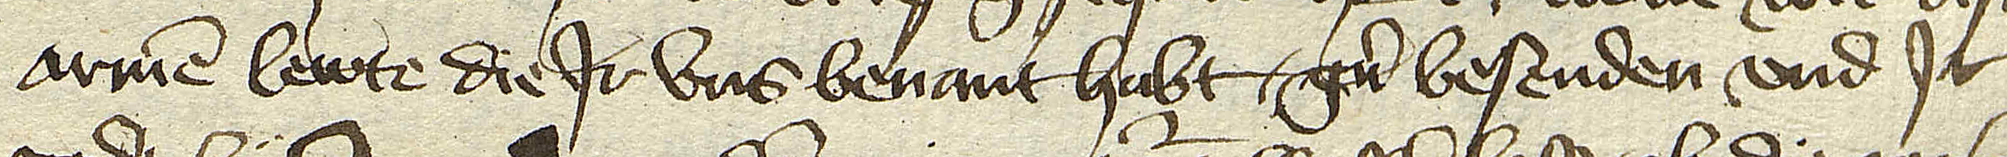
arme* lewte die Ir vns benant habt / gn* beſenden vnd Ir
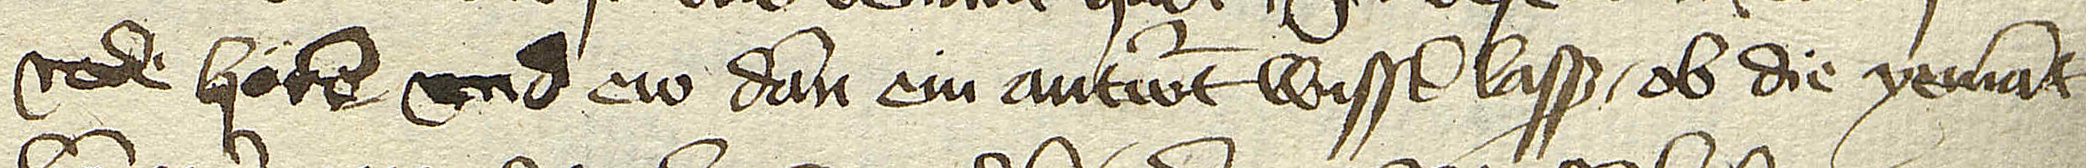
rede höre* vnd ew dan* ein antwt* wiſſe* laſſ* / ob die yemat*
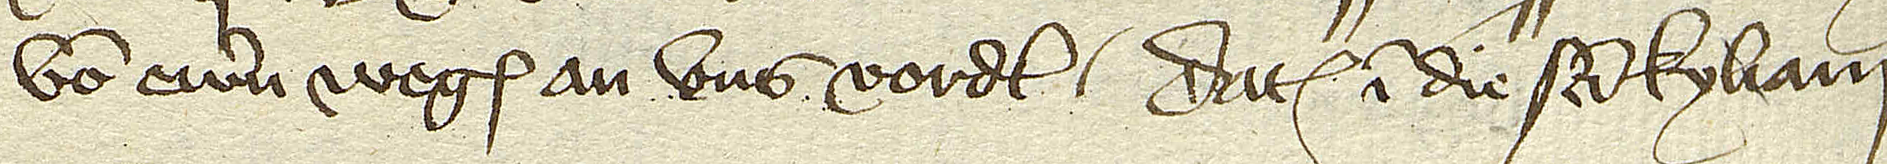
vo* ew*n weg* an vns vordt* / Dat* i* die ſci* kyliani
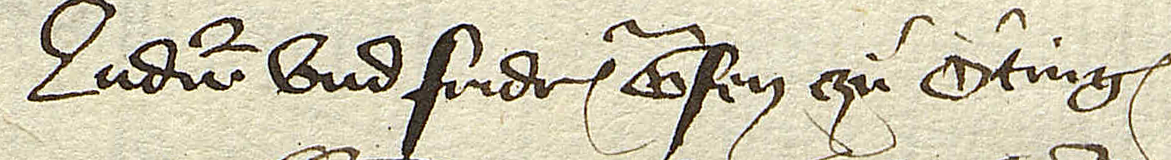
Ludw* vnd fridr* G*fen cʒü Öting*
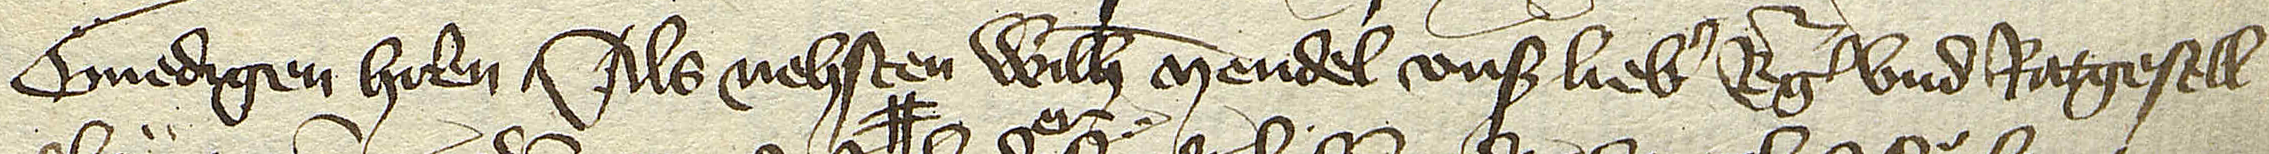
Gnedigen hr*en / Als nehſten Wilh* Mendel vnſ* lieb* B*g* vnd Ratgeſell
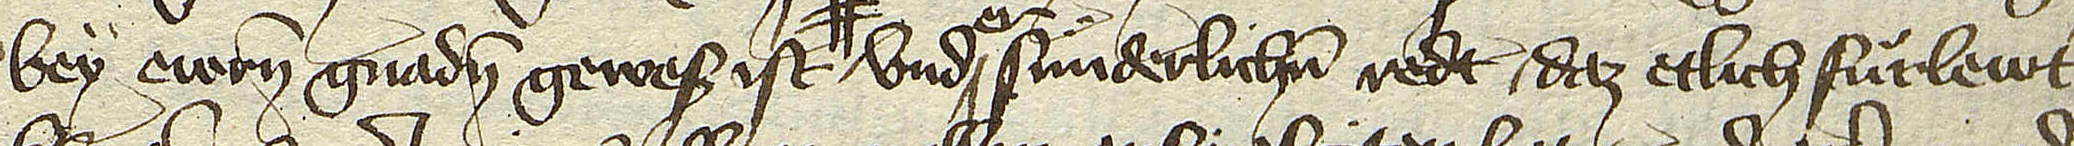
bey ewrn* gnadn* geweſ* iſt / vnd ſünderlichn* redt / daʒ etlich fürlewt
